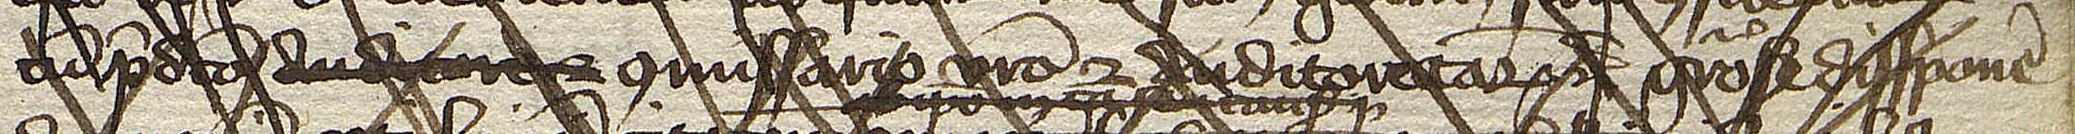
cu* pdco* Auditore @ *miſſario vro* @ Auditorea* ec* groſe* diſſpone*
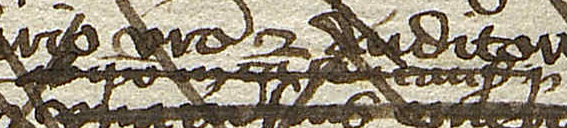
%%%%%%%%%%
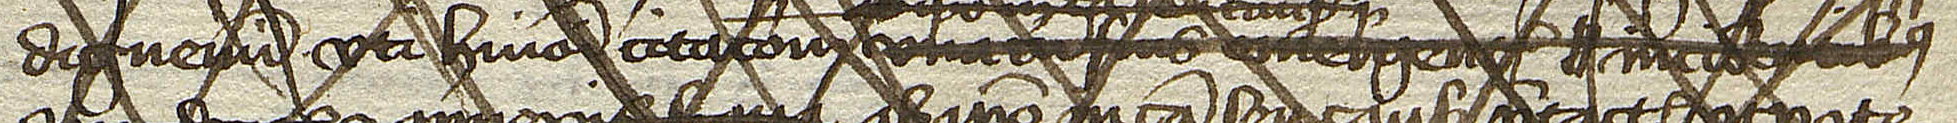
digneui* . vti hiuoi* citacon* vna cu* ſ%%% %%%%% / incidencib*
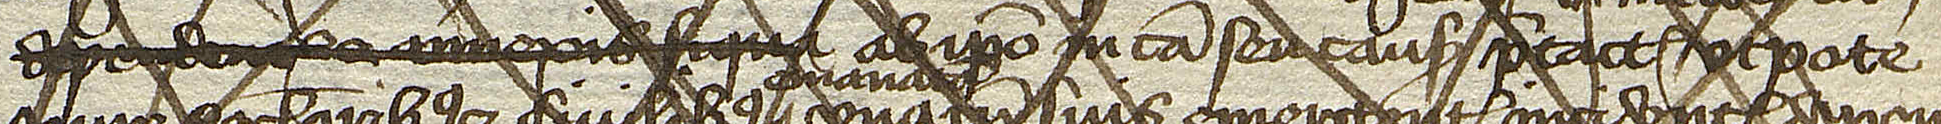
dependen%%% annexis ſiqua ab ipo* in ca* ſeu cauſ* p*tact* vt pote
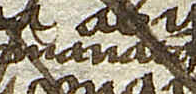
emanata
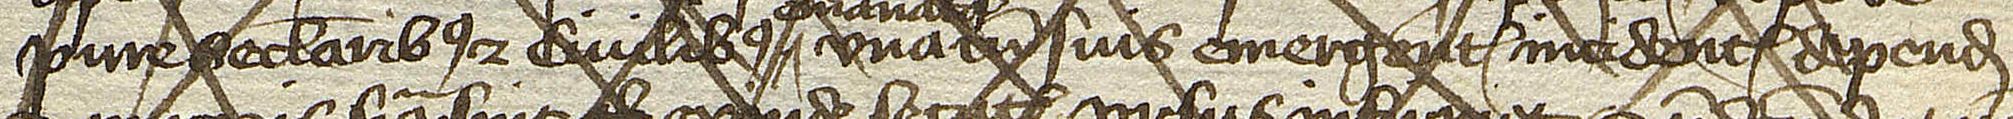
pure Seclarib* @ Ciuilib* vna cu* ſuis emergent* incidenc* depend*
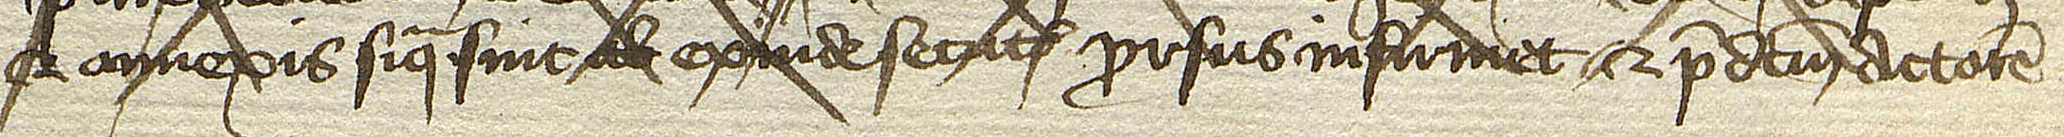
@ annexis ſiq ſ%% ab exinde ſecut p*rſus infirmet / @ p*dcn* Actore*
